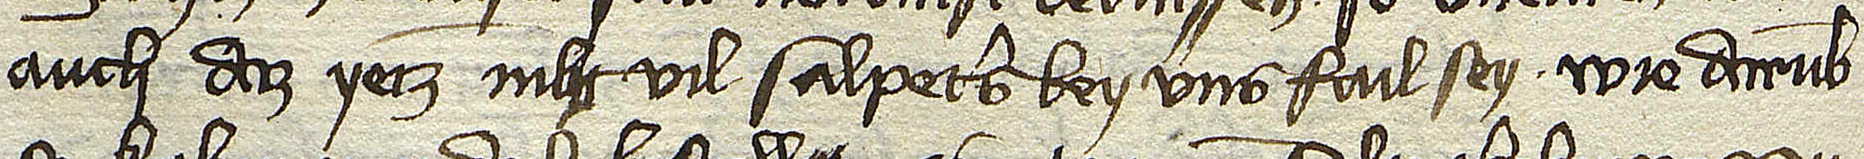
auch daʒ yecʒ* niht vil ſalpet*s bey vns fail ſey . wie daru*b
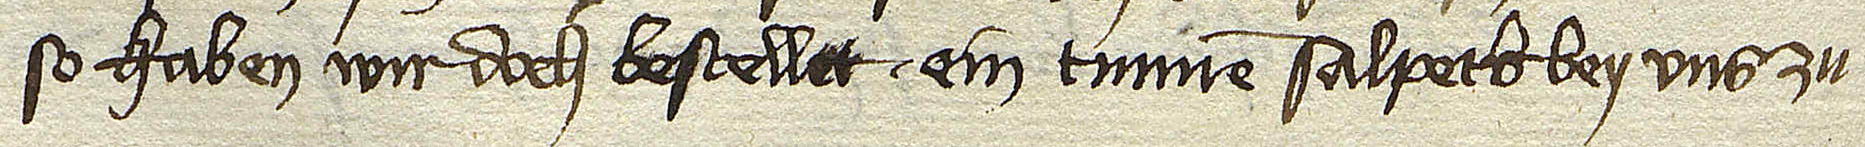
ſo haben wir doch beſtellet . ein tunne* ſalpet*s bey vns ʒu
